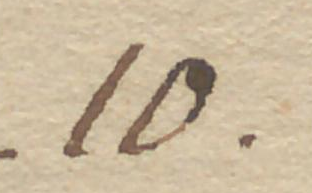10.
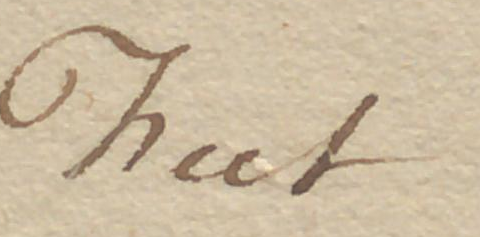Feet
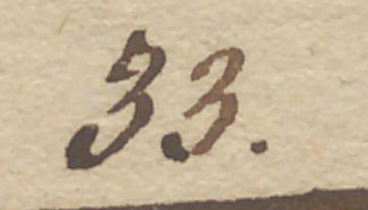33.
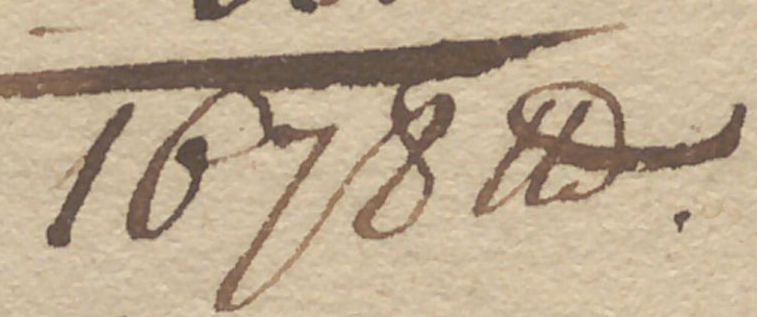1678 lb.
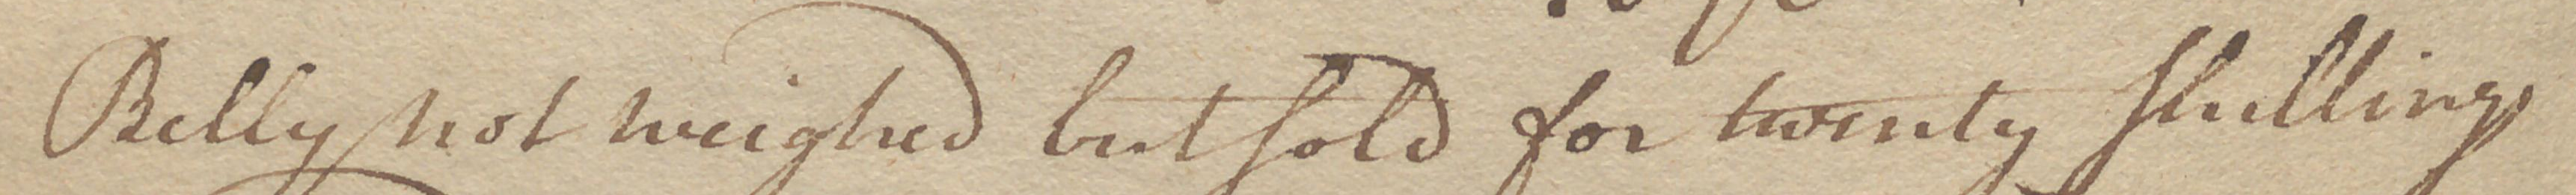Belly not weighed but sold for twenty shillings
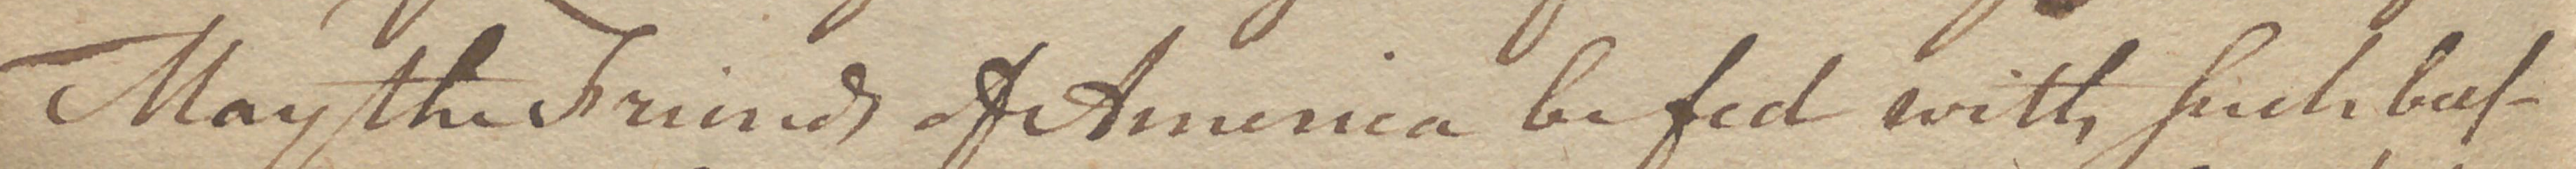May the Friends of America be fed with such beef
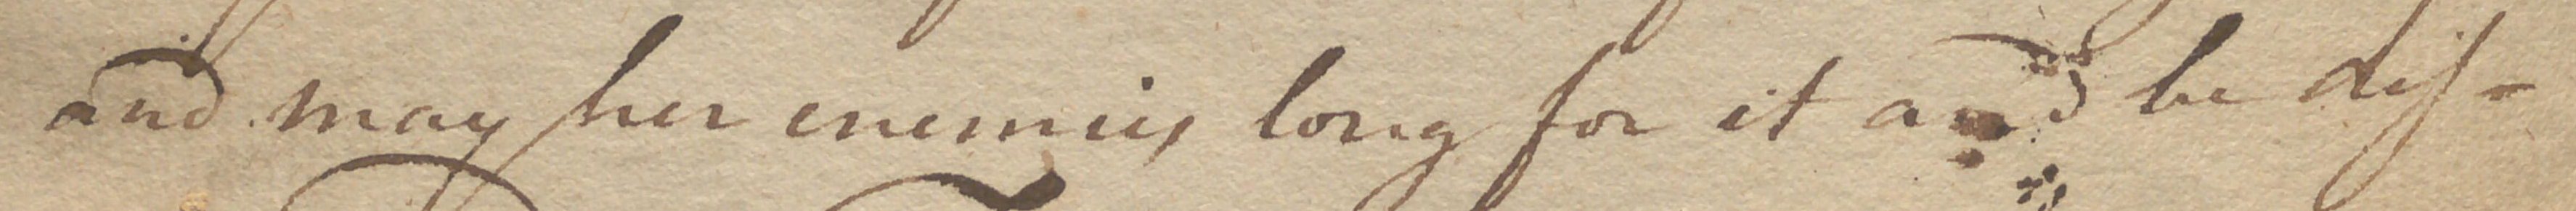and may her enemies long for it and be dis-
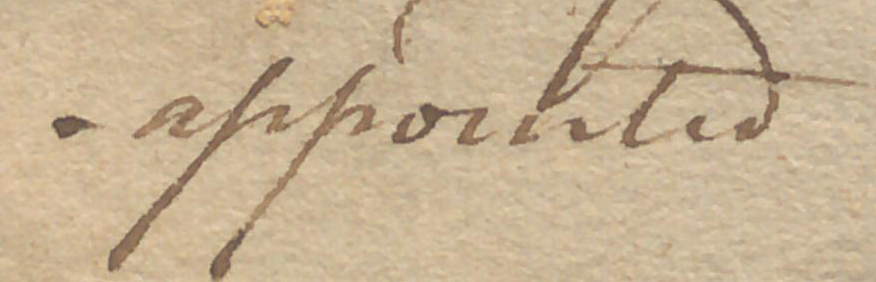appointed
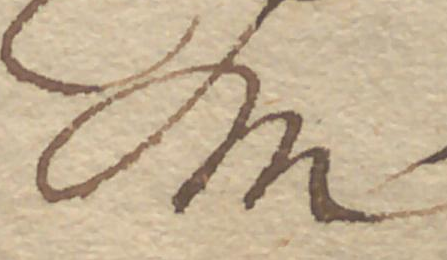M
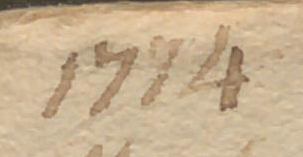1774
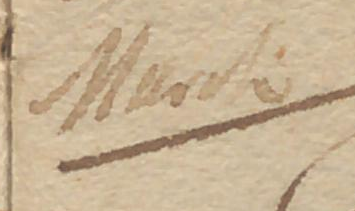March
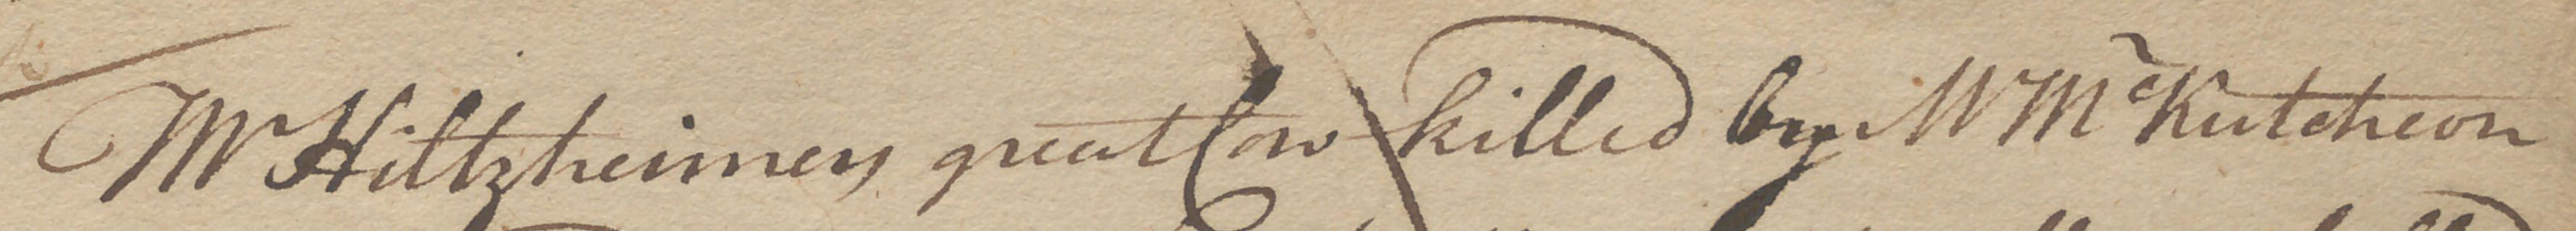M^r Hiltzheimers great Cow killed by M^r M^cKutcheon
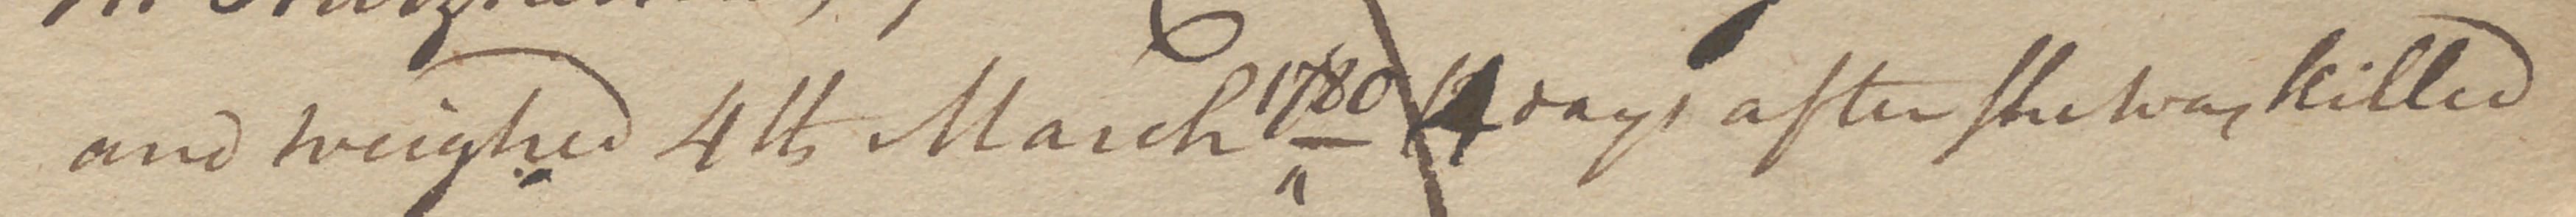and weighed 4th March 1780 14 days after the was Killed
